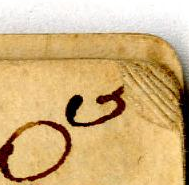5
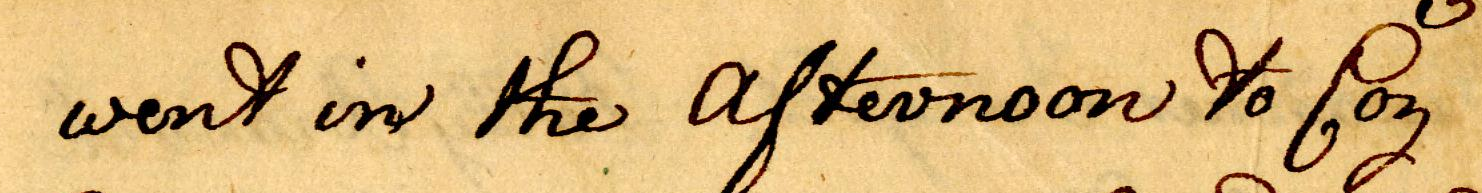went in the Afternoon to Coz
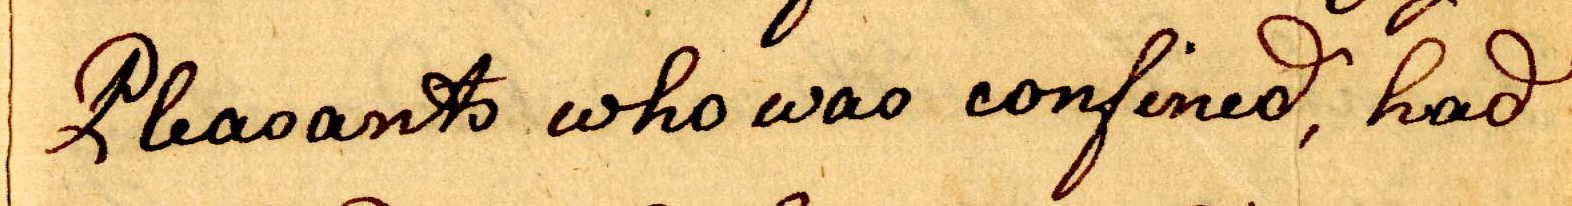Pleasants who was confined, had
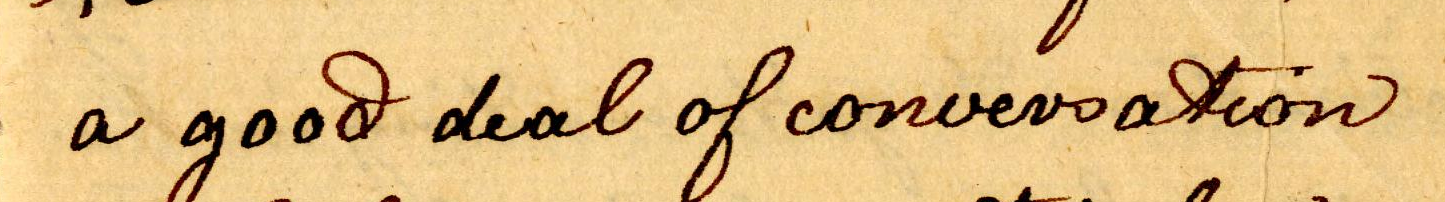a good deal of conversation
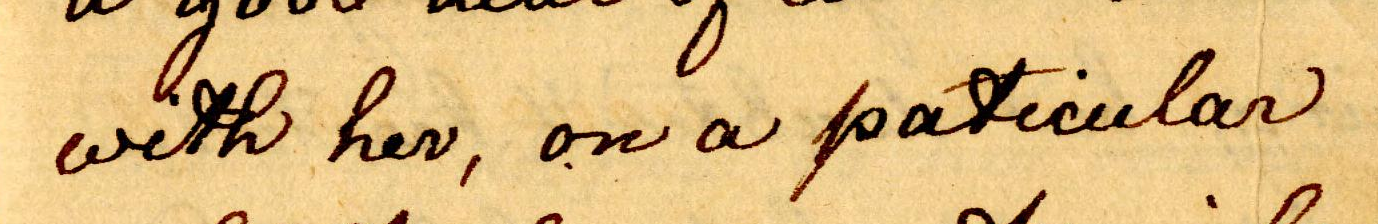with her, on a paticular
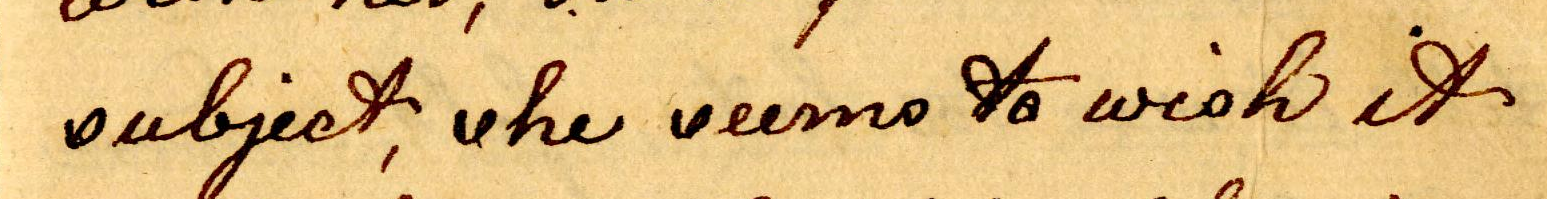subject, she seems to wish it
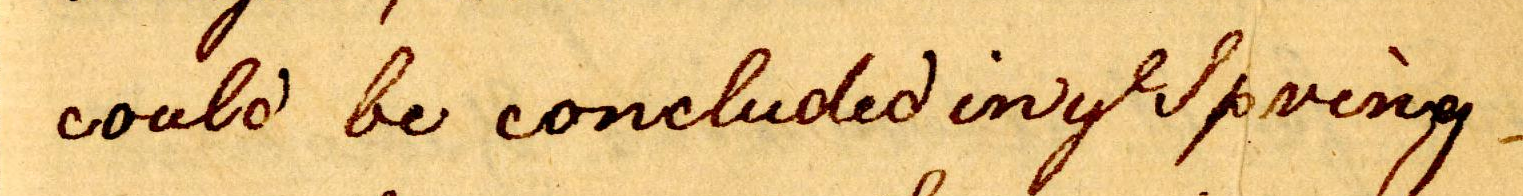could be concluded in y^e Spring-
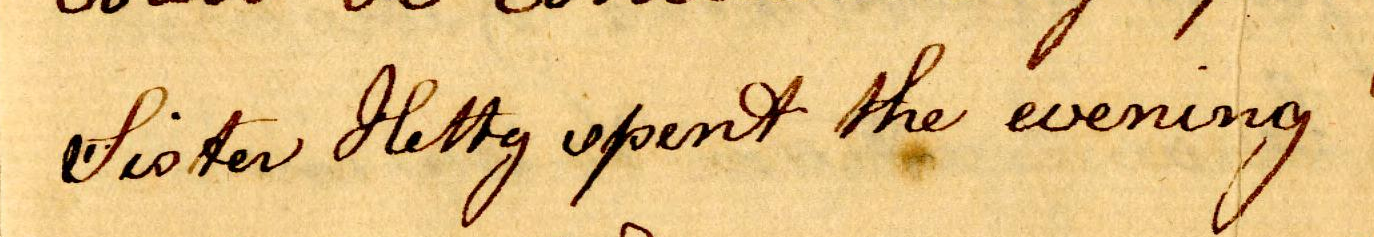Sister Hetty spent the evening
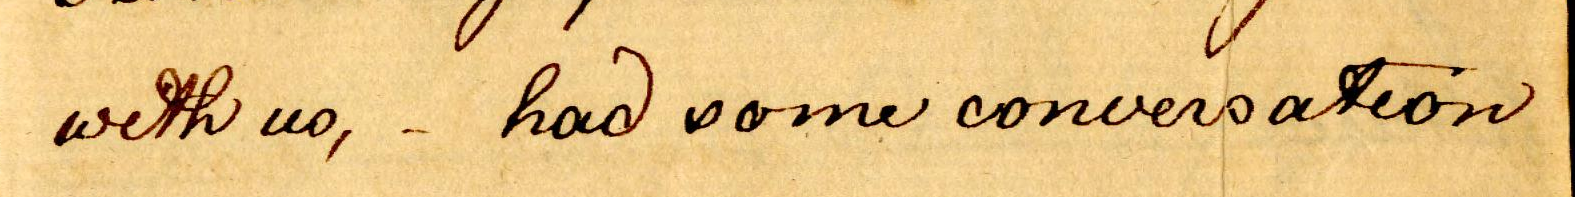with us,- had some conversation
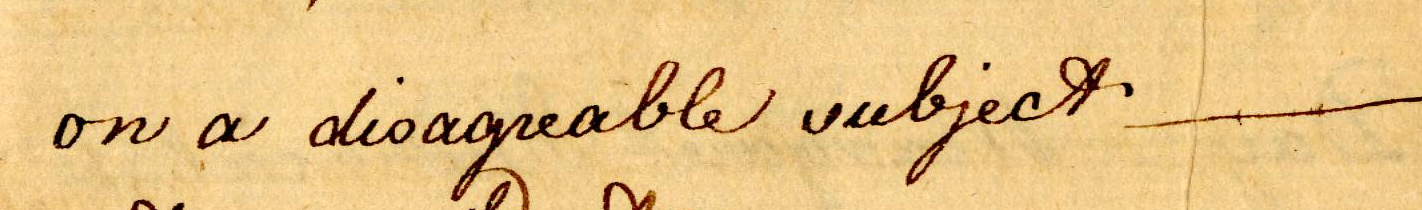on a disagreable subject-
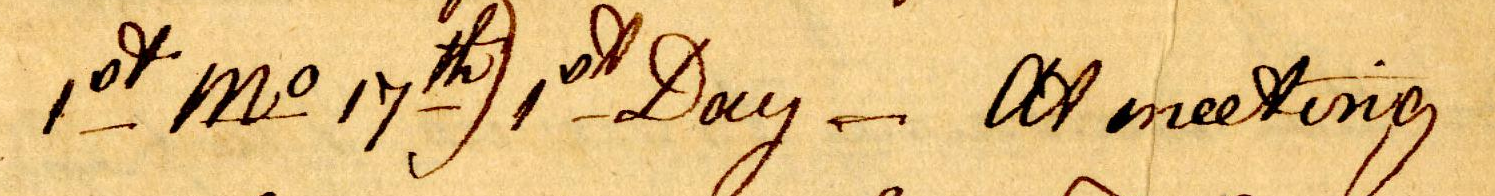1^st M^o 17^th) 1^st Day- At meeting
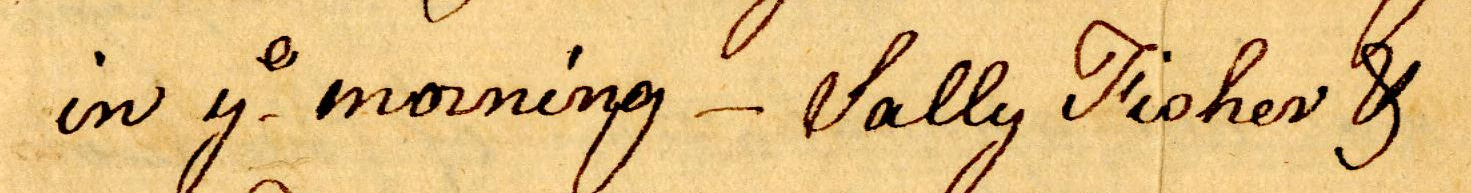in y^e morning- Sally Fisher &
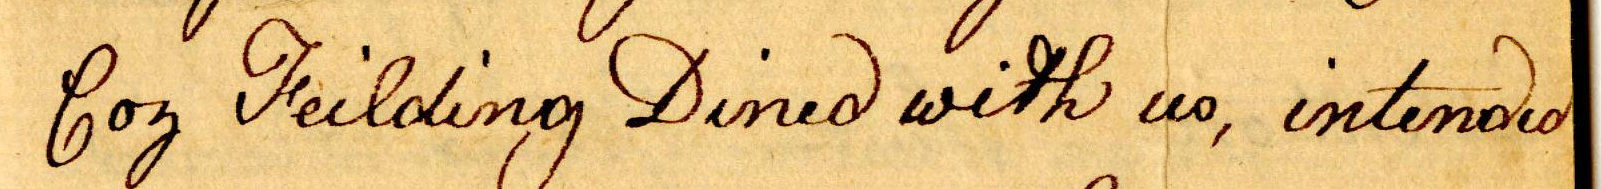Coz Feilding Dined with us, intended
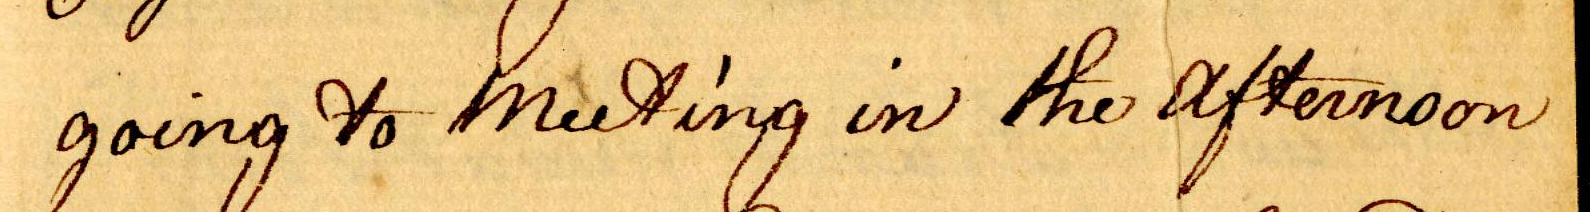going to Meeting in the Afternoon
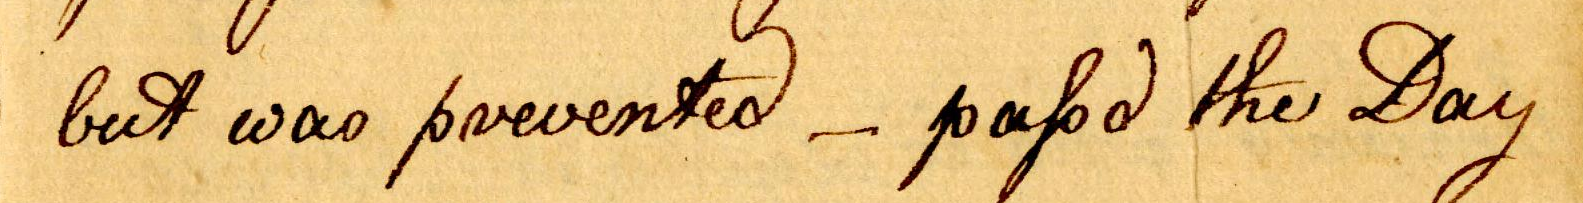but was prevented- passd the Day
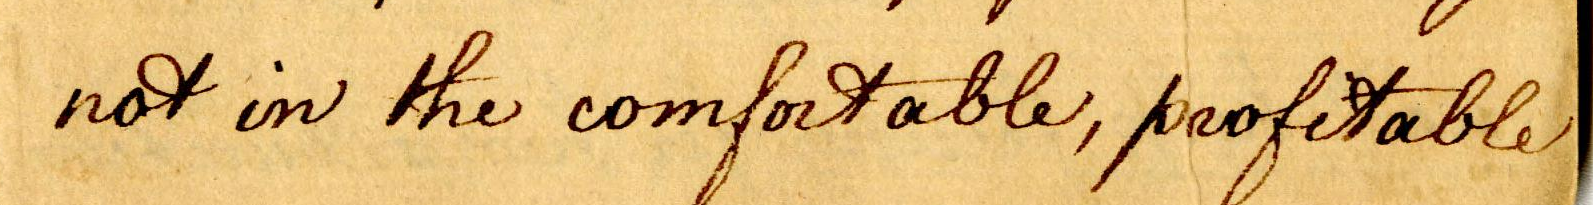not in the comfortable, profitable
